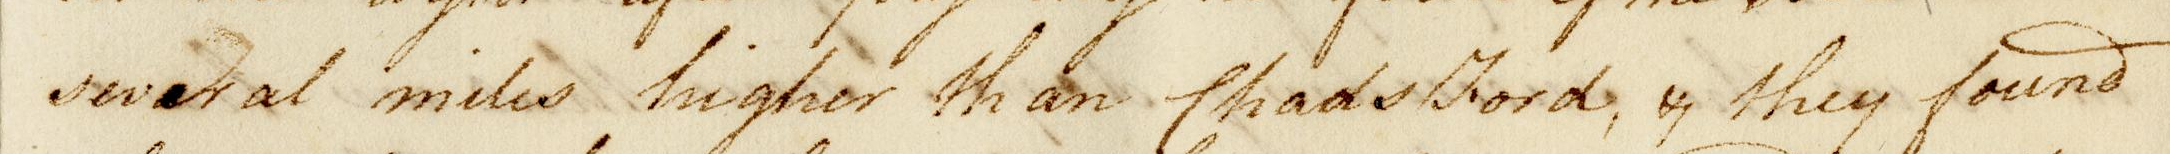several miles higher than Chads Ford, & they found
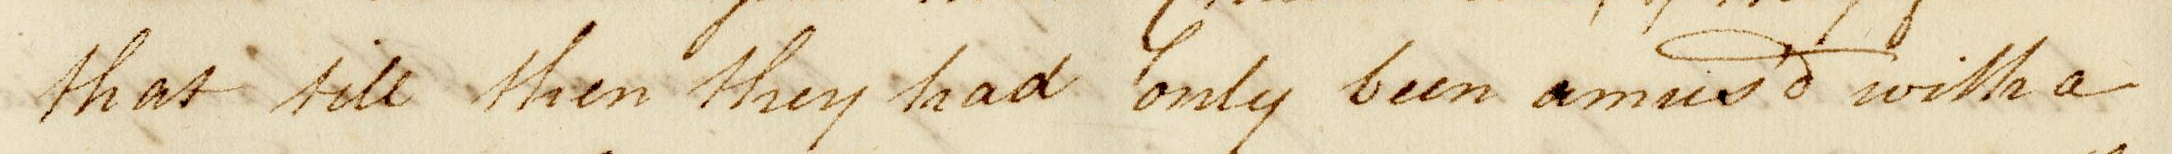that till then they had only been amus'd with a
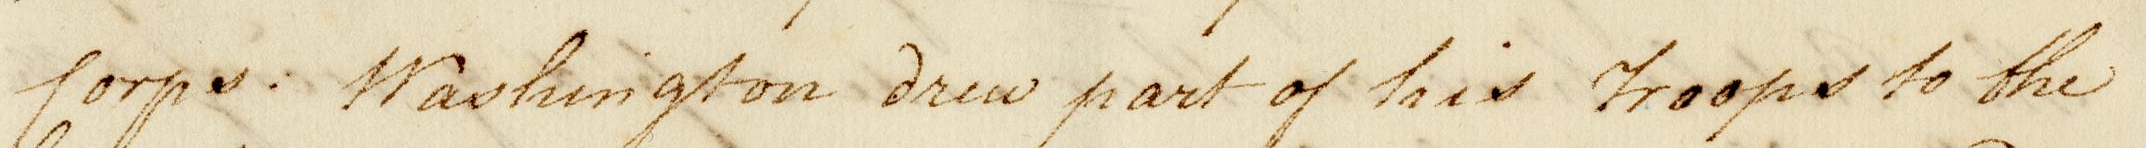Corps: Washington drew part of his Troops to the
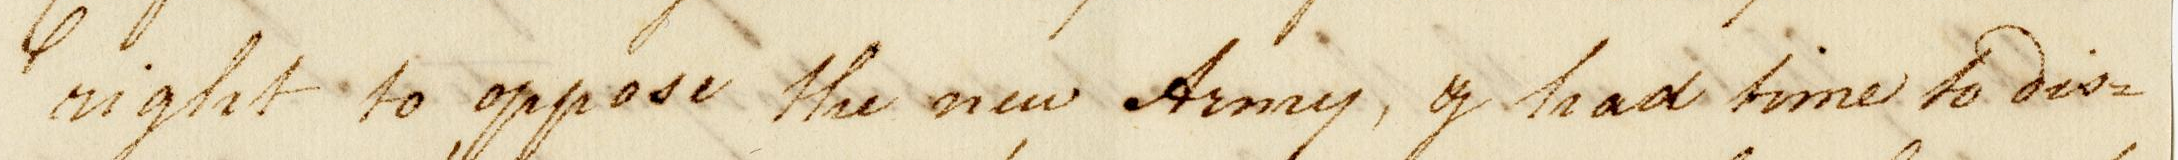right to oppose the new Army, & had time to dis-
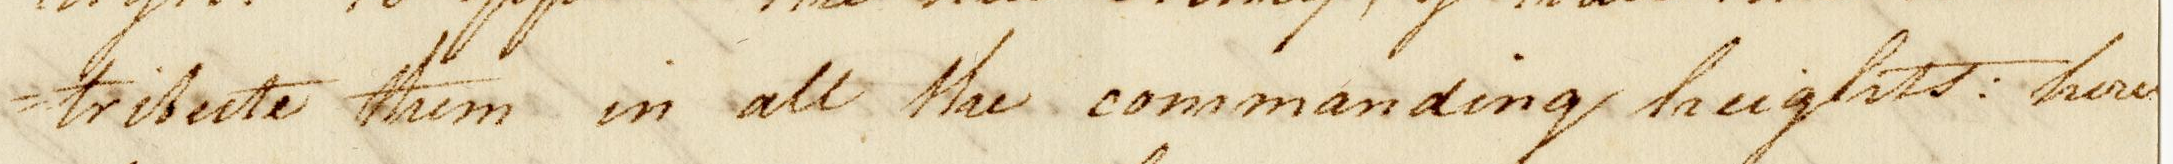-tribute them in all the commanding heights: here
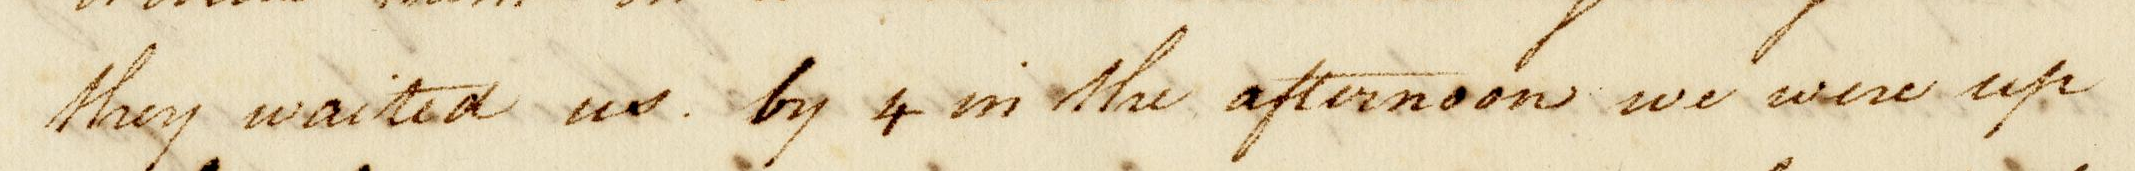they waited us. by 4 in the afternoon we were up
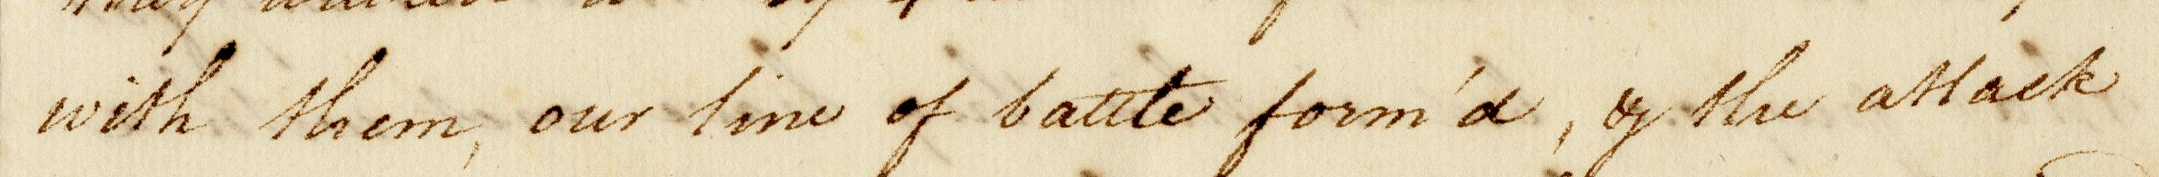with them, our tine of battle form'd, & the attack
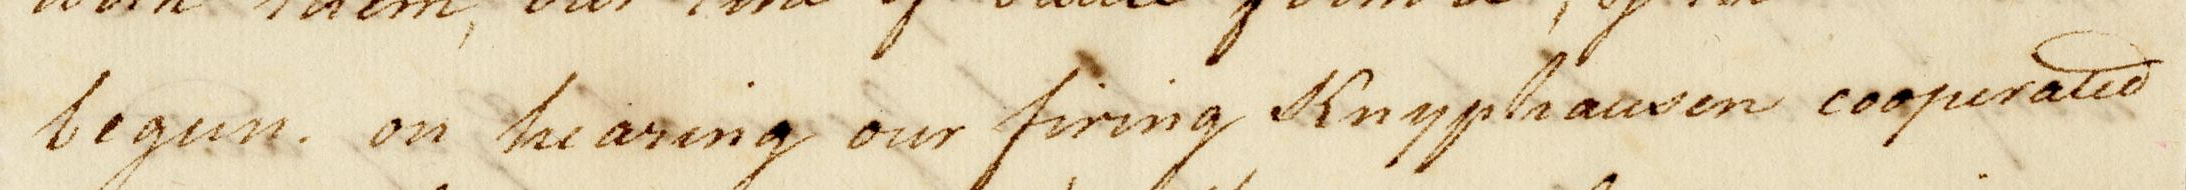begun. on hearing our firing Knyphausen cooperated
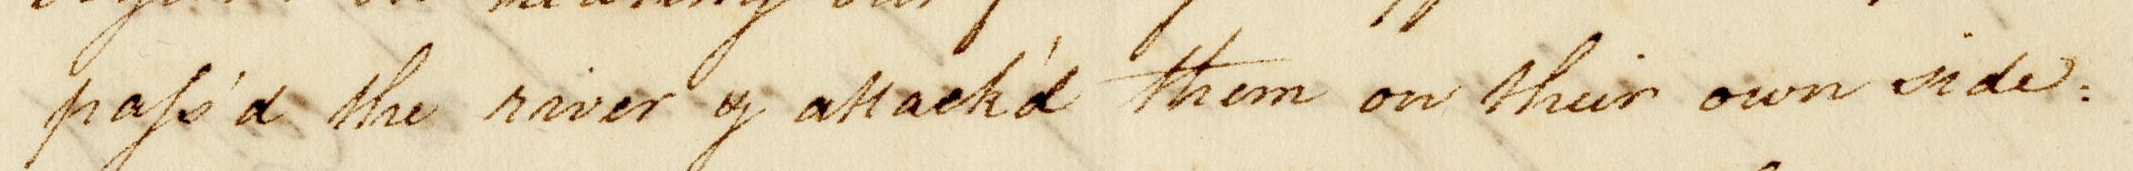pass'd the river & attack'd them on their own side:
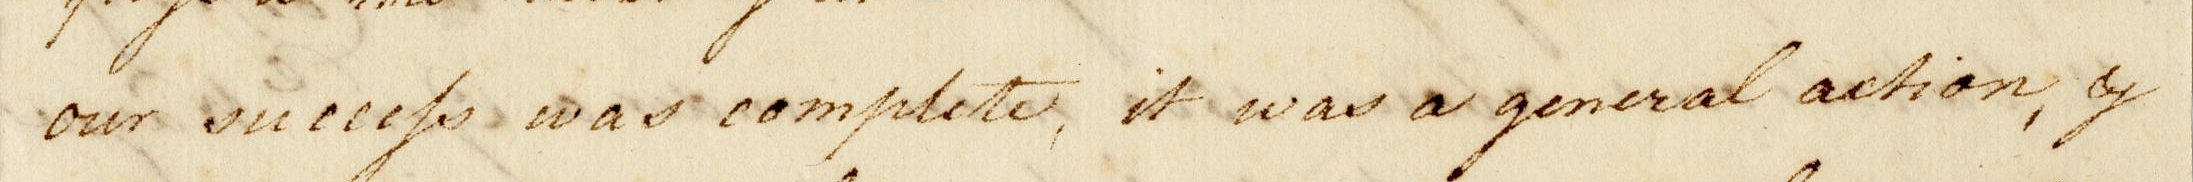our success was complete, it was a general action, &
